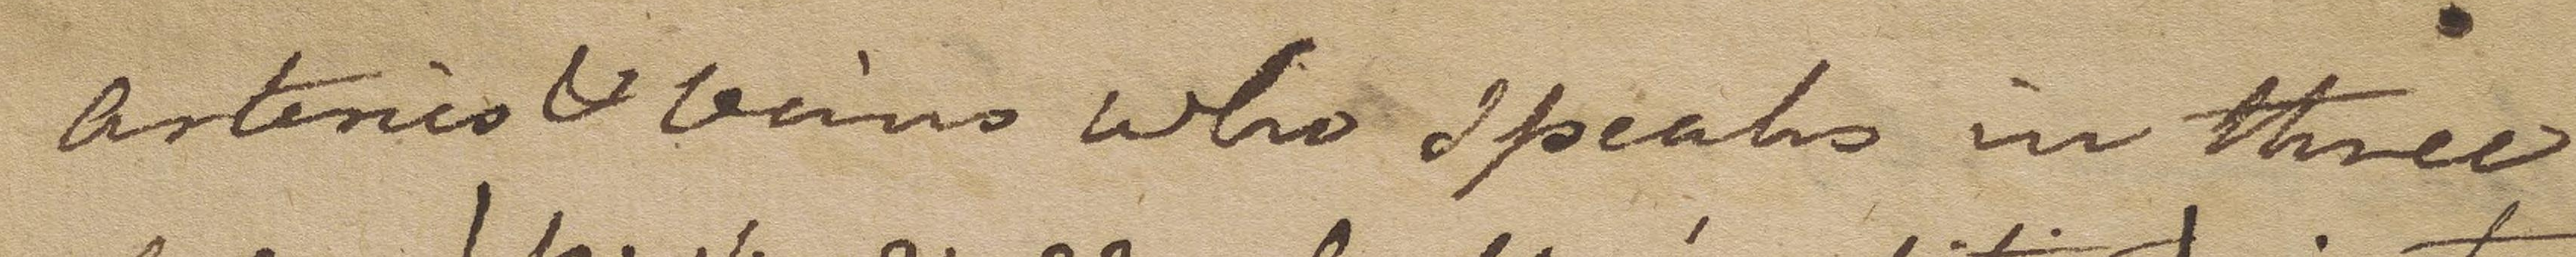arteries & veins who speaks in three
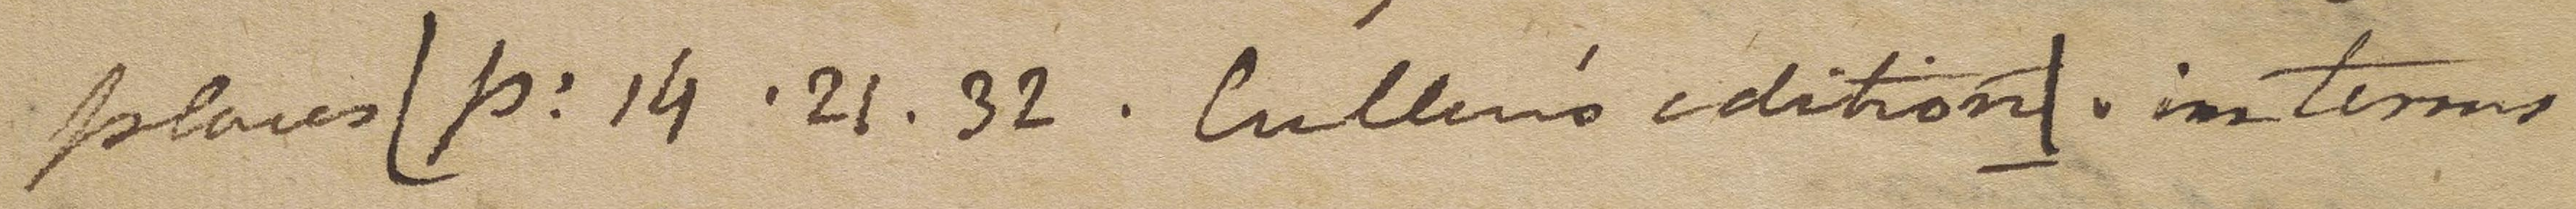places (p. 14, 21, 32 Cullen's edition) in terms
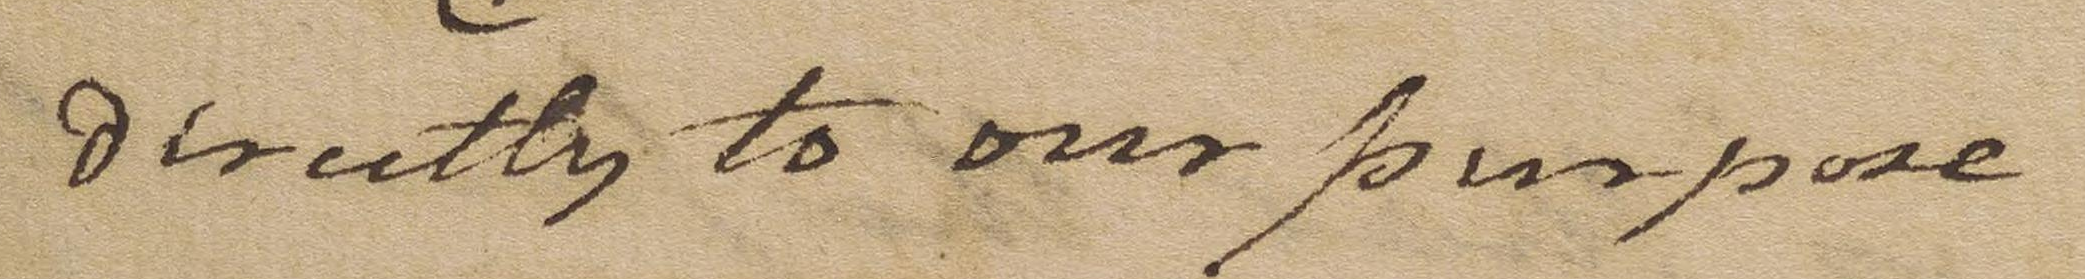directly to our purpose.
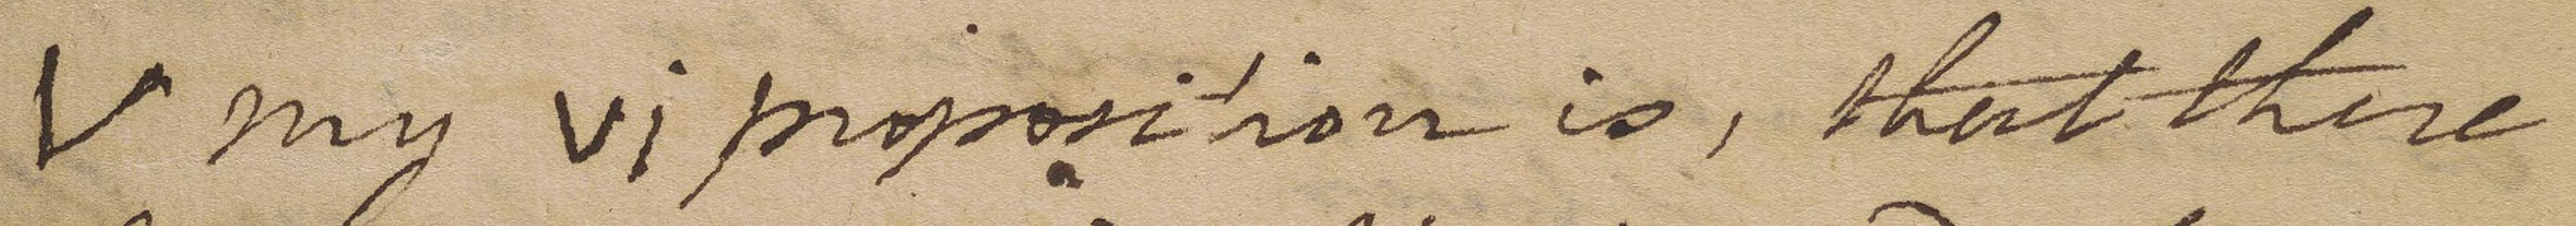V My VI proposition is, that there
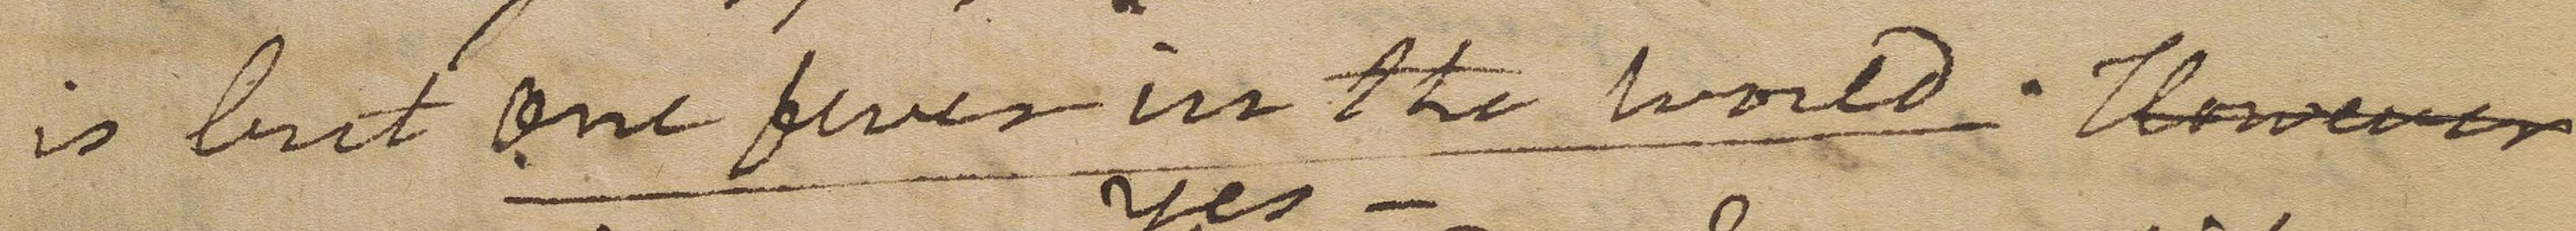is but one fever in the world. [However]
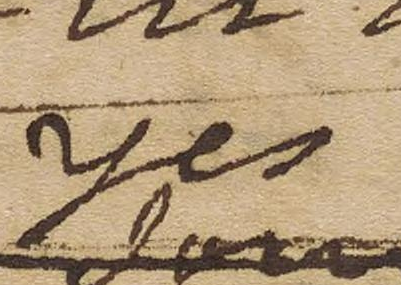yes
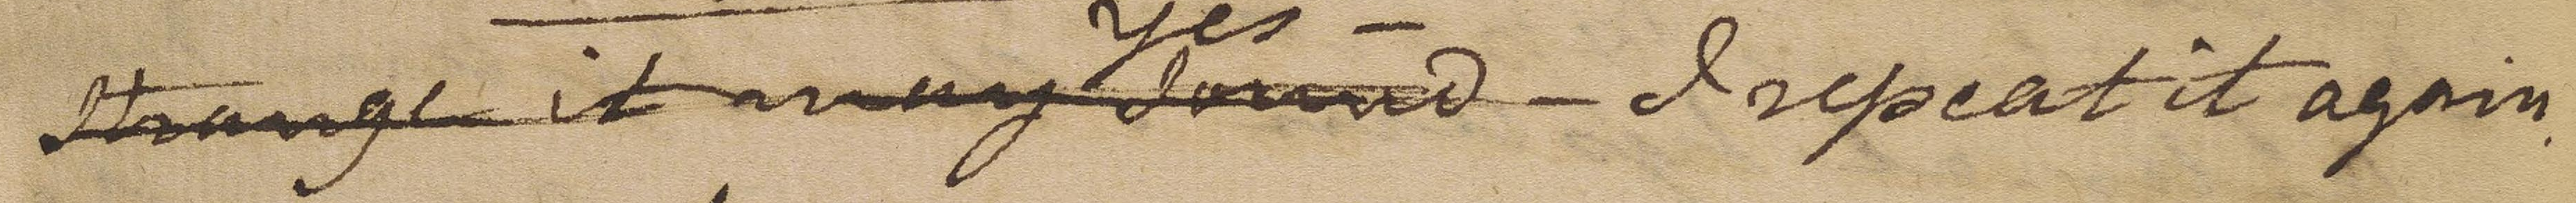[strange it may seem]- I repeat it again
